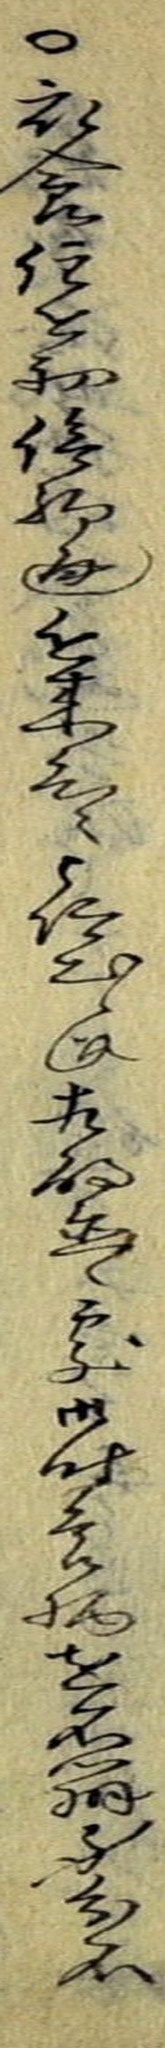○衣食住を初倹約通近来度々被仰出候趣相触置候処御時節柄を不弁身分不
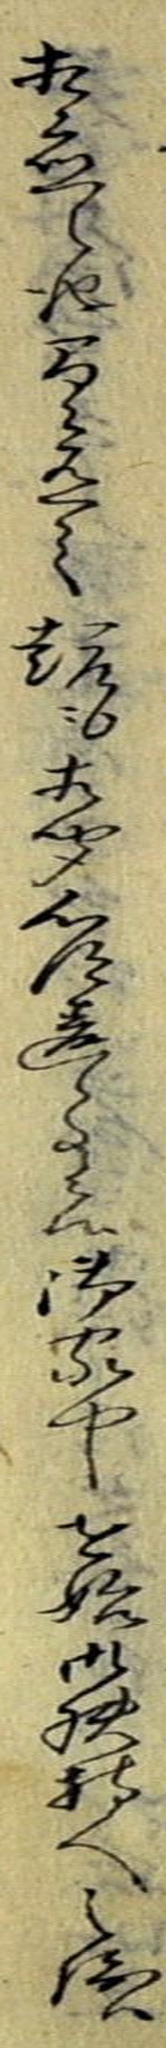相応之儀間々有之趣も相聞心得違之事に候御家中を始御扶持人之儀は

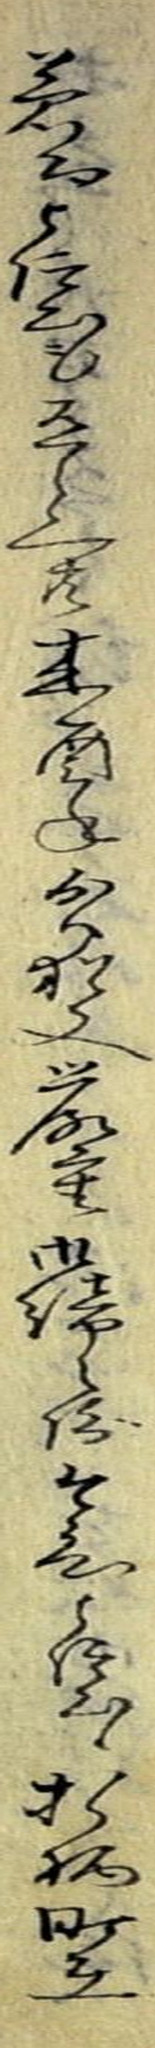兼而被仰出も有之候へ共来酉年ゟは猶又厳重御締之儀今度被仰出候折柄町在
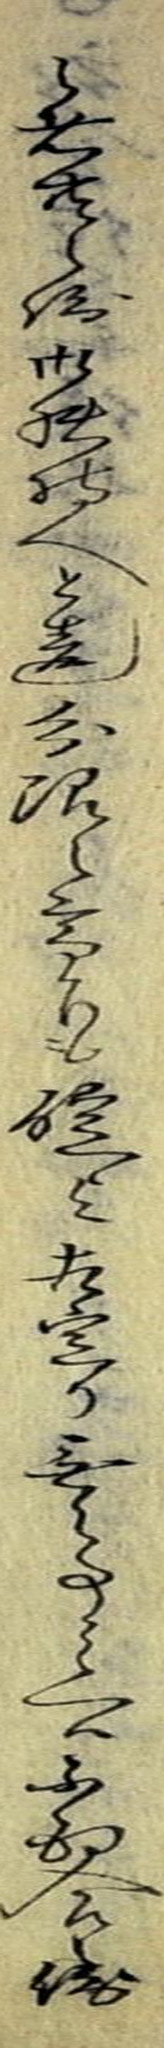之者共之儀御扶持人と違分限之高下も聢と相定り無之候へは不釣合之儀
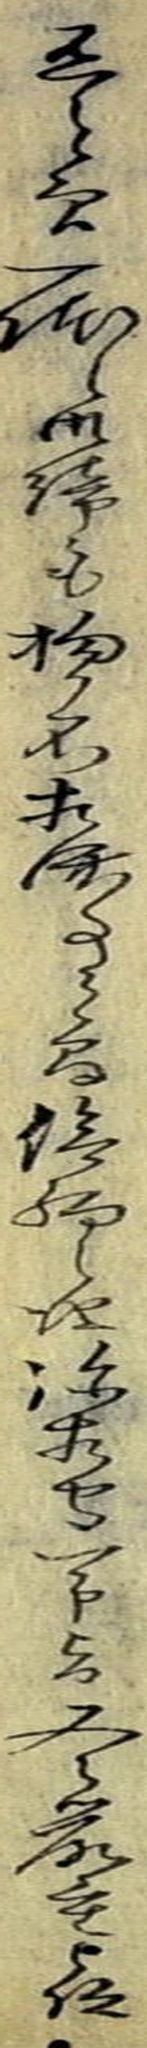有之候而は一体之御締にも拘り不相済事に候間倹約之儀弥相守可申旨又々厳重被仰
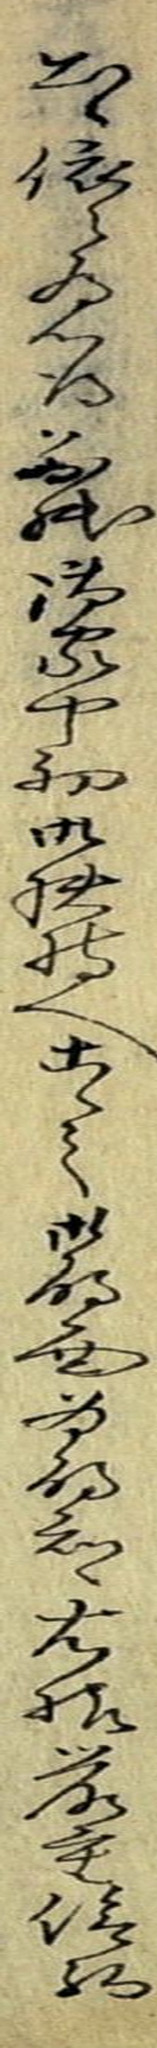出候依之為心得別紙御家中初御扶持人等へ之御触面？為触知候左様厳重倹約
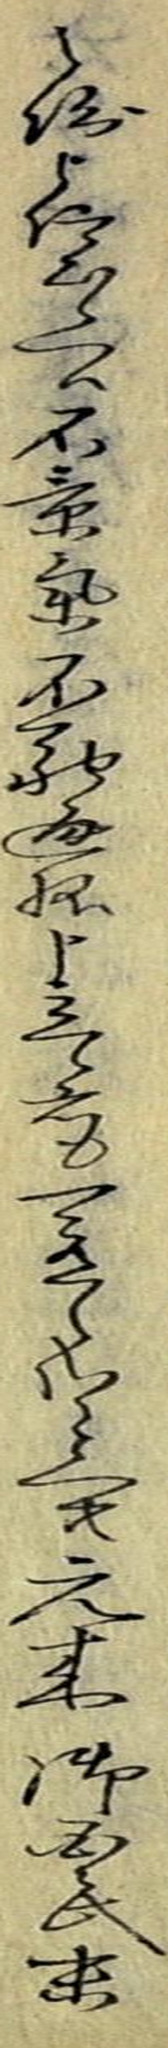之儀被仰出候へは不景気不融通抔申立候者も可有之哉に候へ共元来御国民末
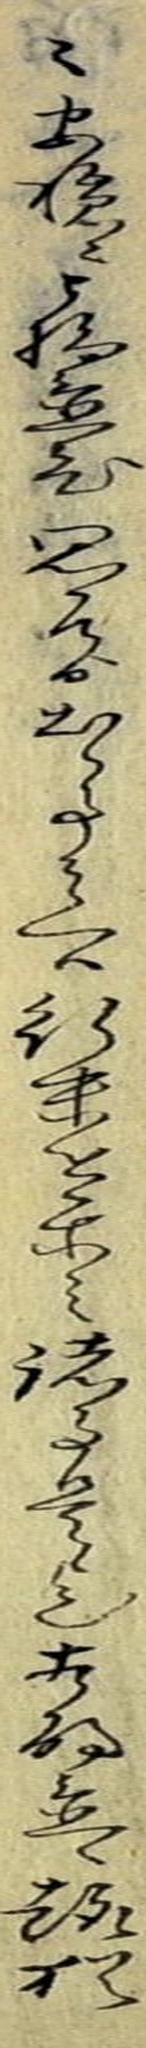々安穏に被指置度思召ゟ出候事に候へは行末を楽之諸事是迄相触置候趣猶
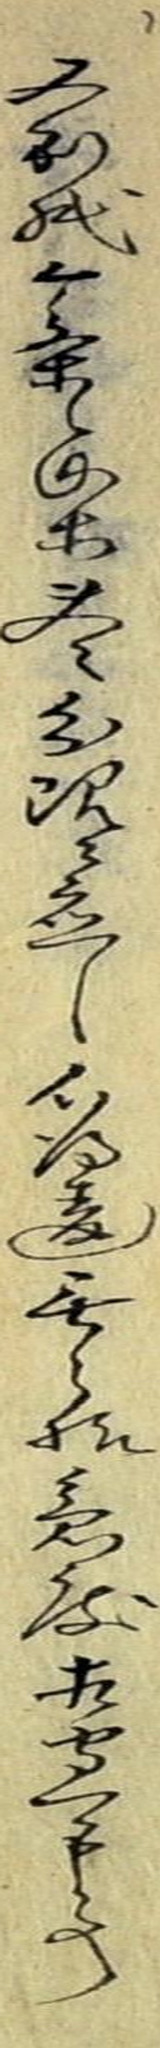又別紙ヶ条之趣等夫々分限に応し心得違無之様急度相守可申事
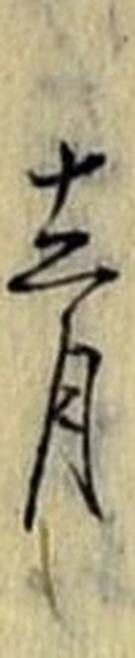十二月
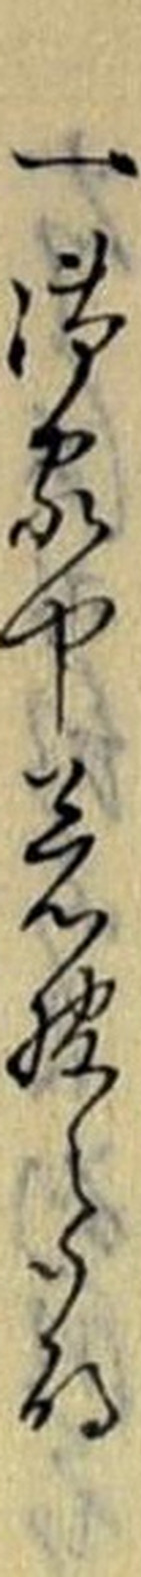一御家中着服之御触
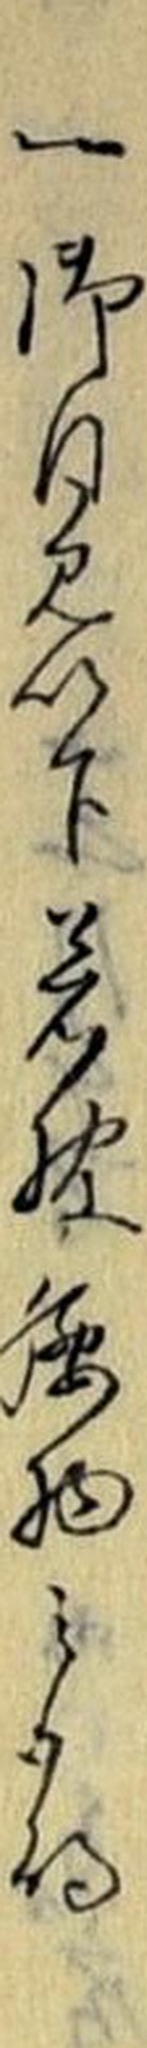一御目見以可着服腰物之御触
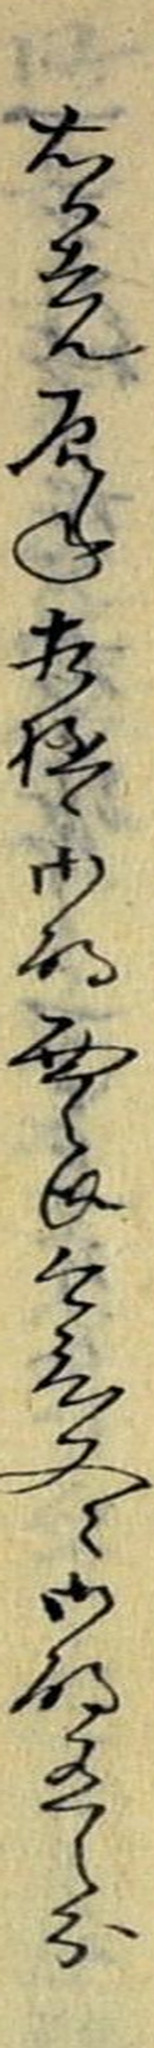右は去辰年相極候御触面？之趣今度又々御触有之分
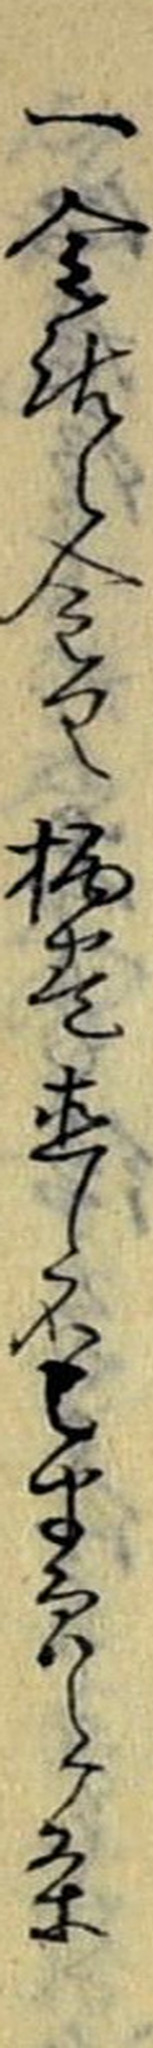一金銀之金具柄巻直し不申半而は之ヶ条
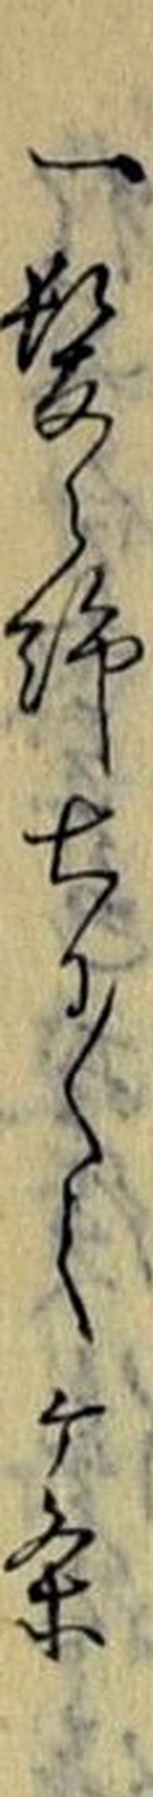一髪之飾りちり〳〵之ヶ条
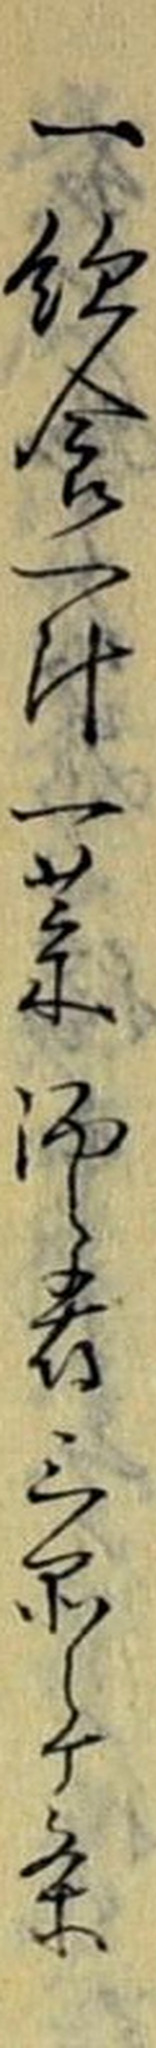一飲食一汁一菜酒之肴三品之ヶ条
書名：命令之部 六
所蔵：福井県文書館 Fukui Prefectural Archives
